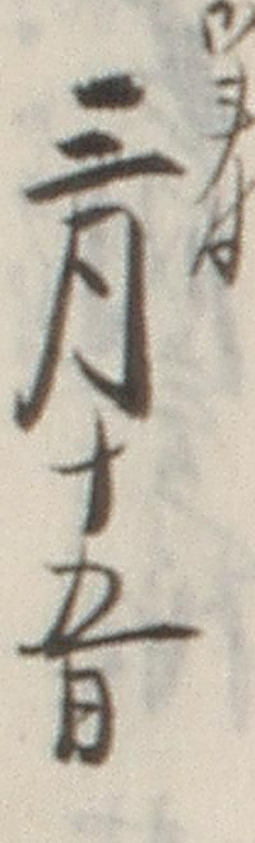三月十五日
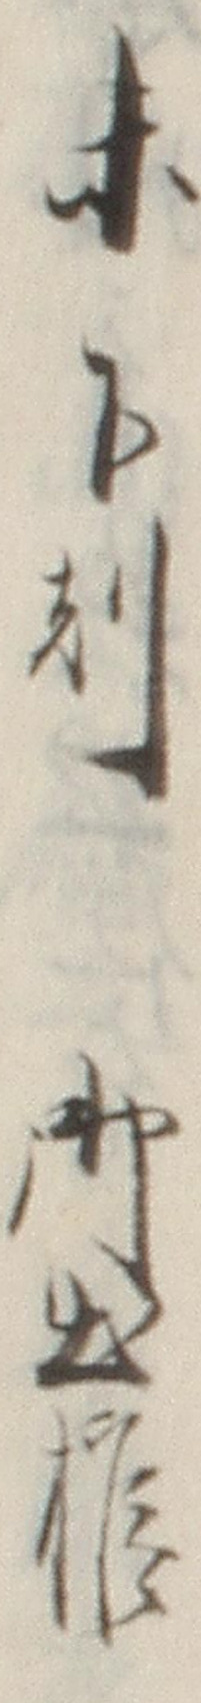未下刻御出棺
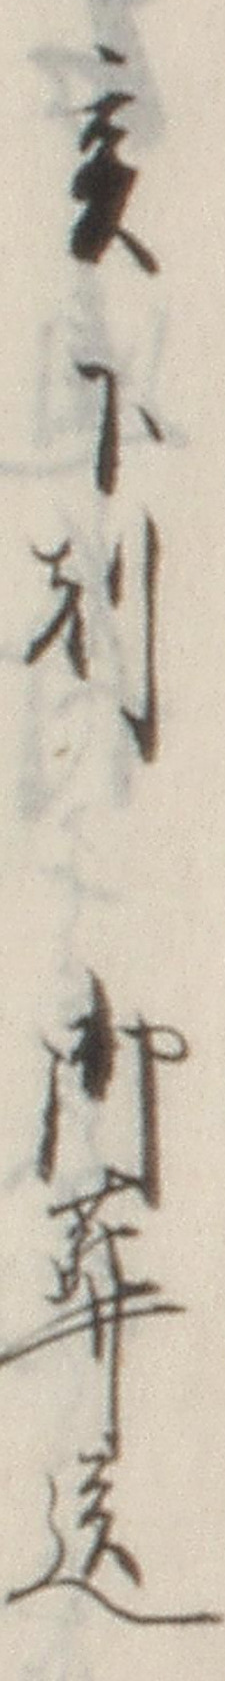亥下刻御葬送

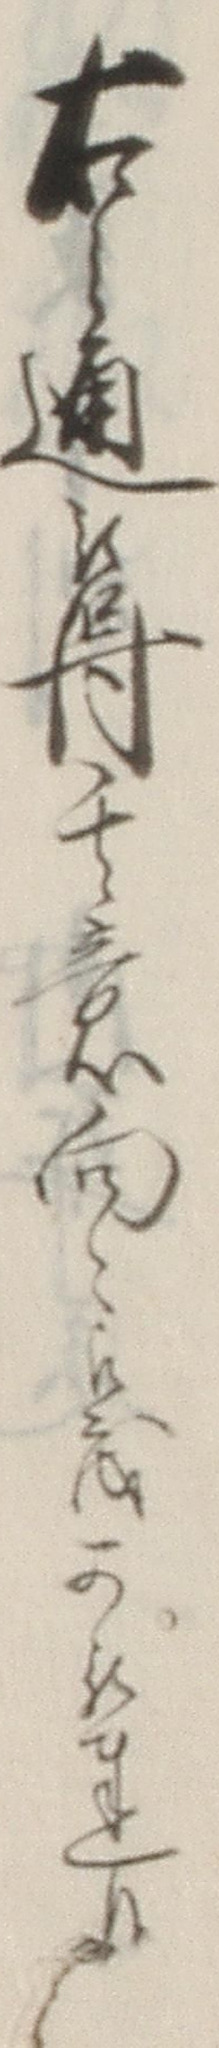右之通被得其意向々江も可被達候
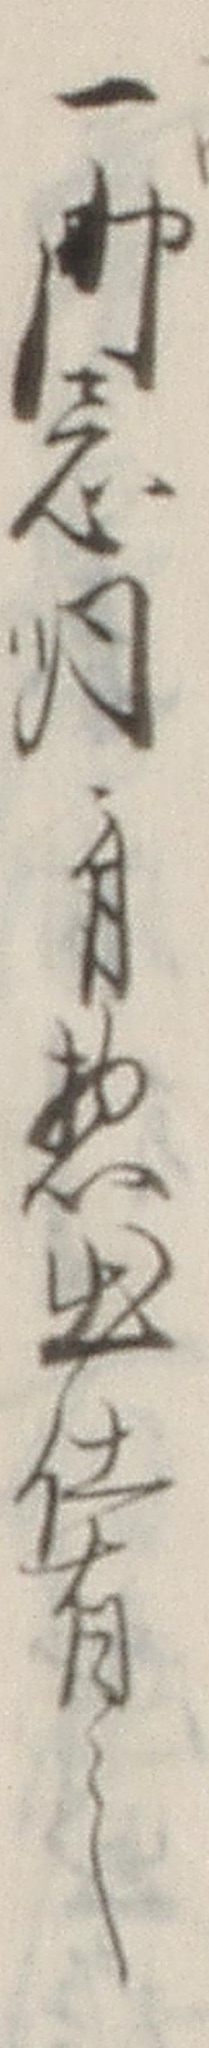一御忌明ニ付惣出仕有之
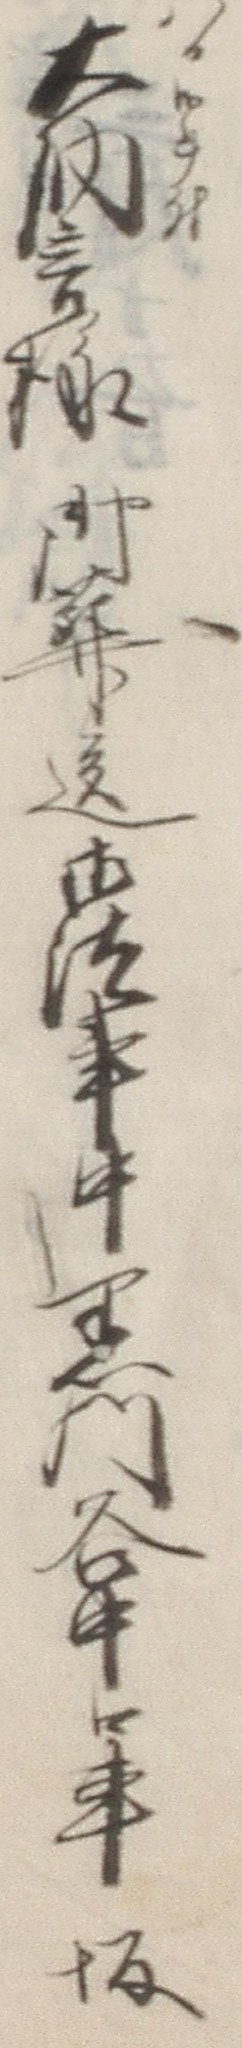大納言様御葬送御法事中黒門谷中口車坂
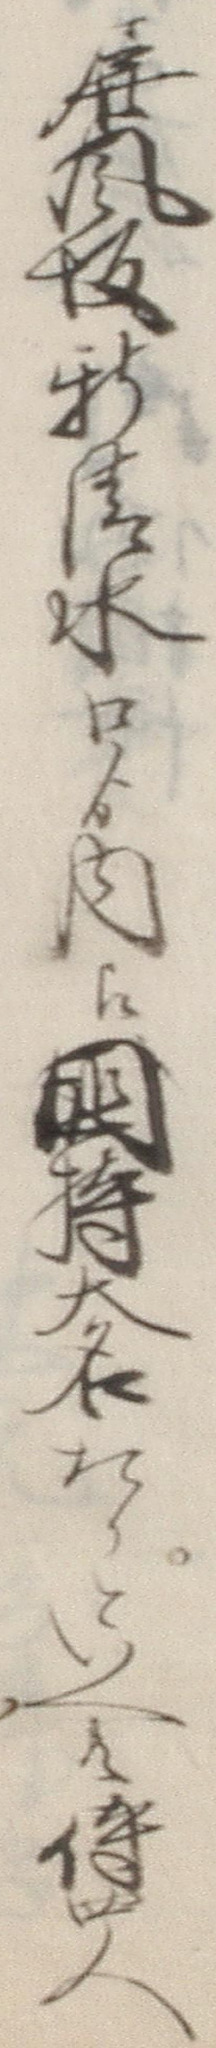屏風坂新清水口ゟ内江国持大名たりといへ共侍四人
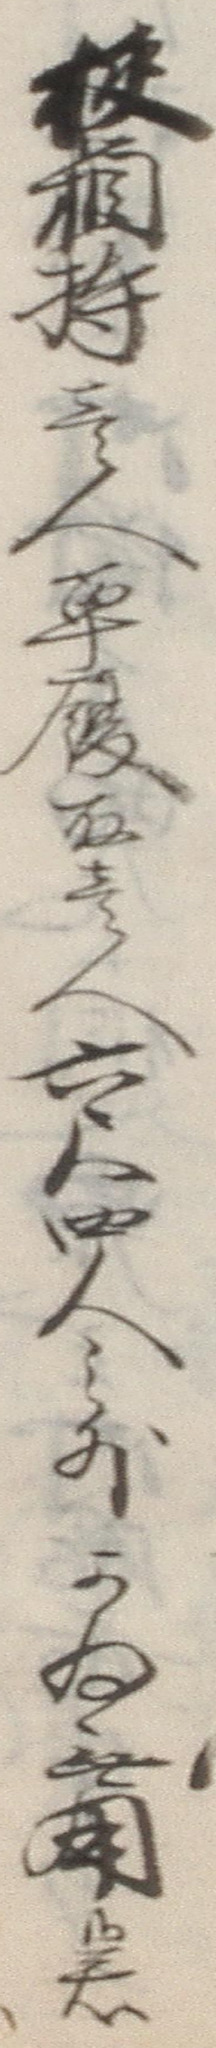挟箱持壱人草履取壱人六尺四人之外可為無用候若
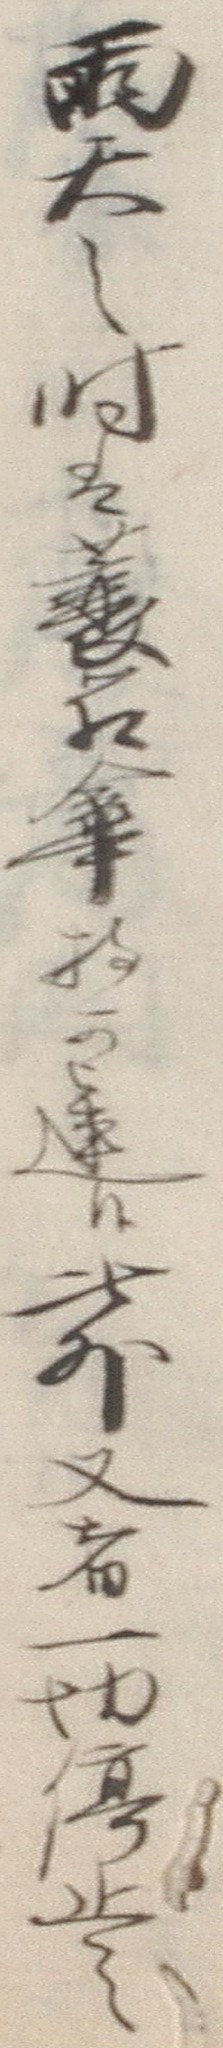雨天之時は蓑箱傘持可被連候此外又は一切停止之
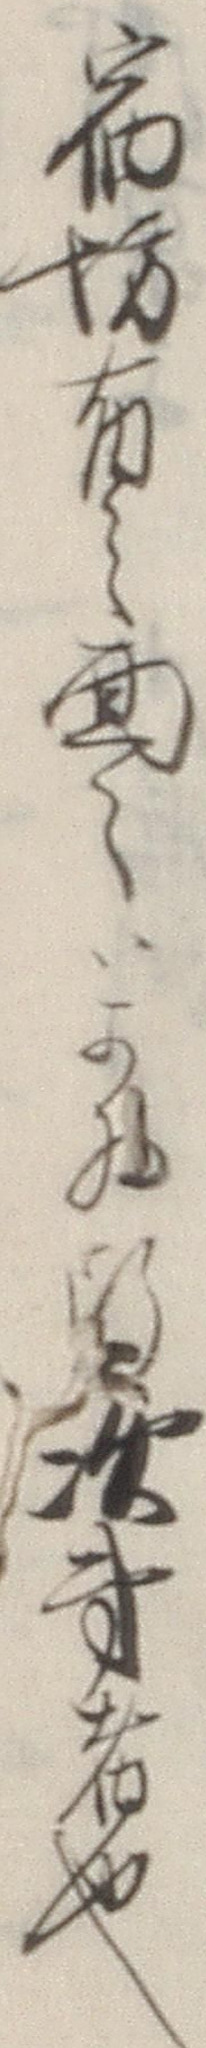宿坊有之面々ハ可為断次第者也
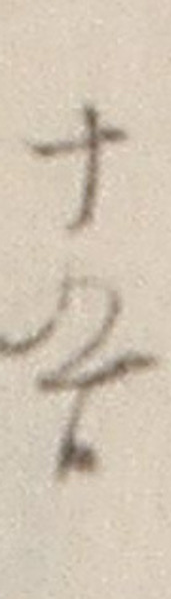十九日
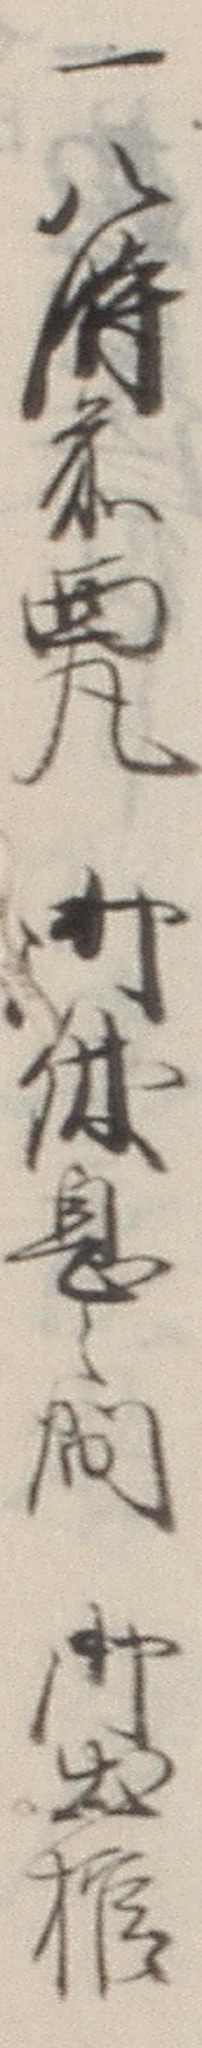一八時前西丸御休息之間御出棺
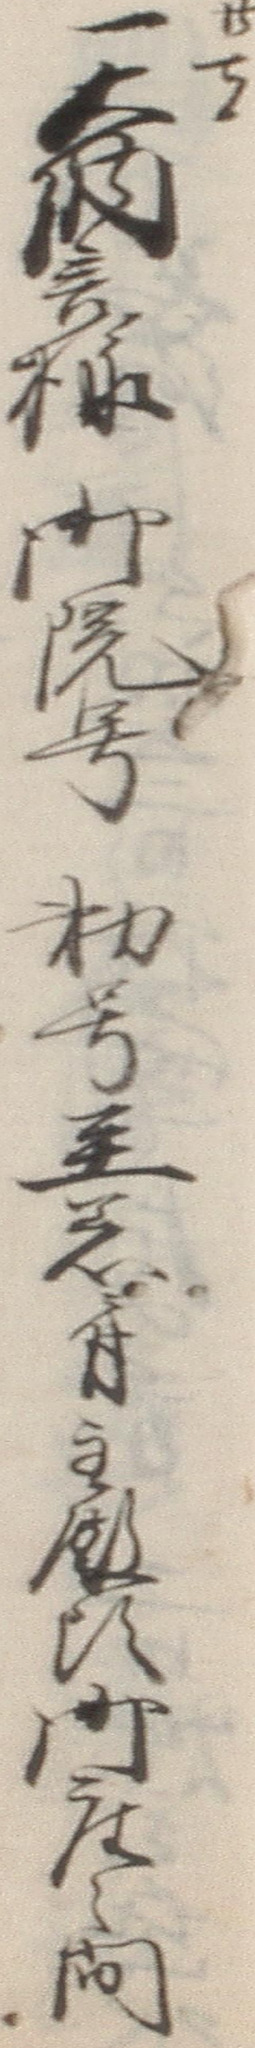一大納言様御院号勅号至着ニ付主殿頭御座之間
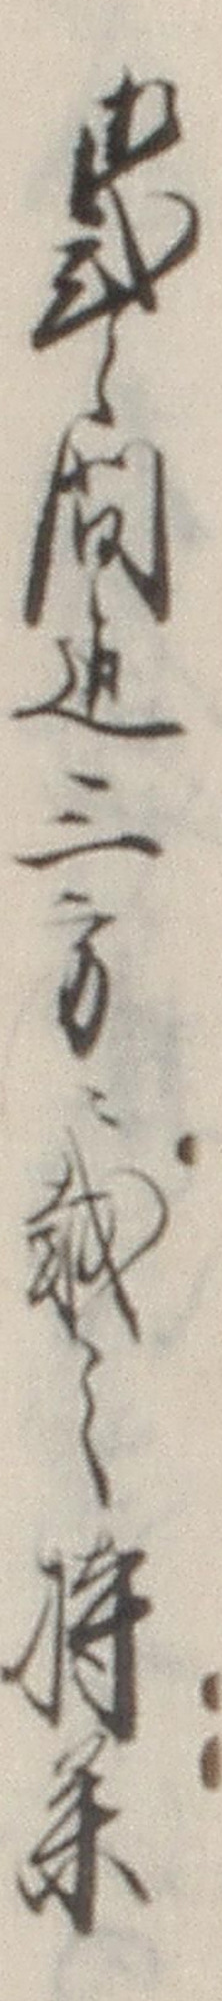御弐之間迄三方ニ載之持参
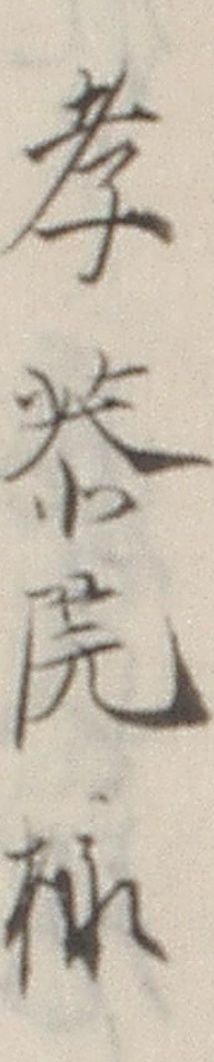孝恭院様
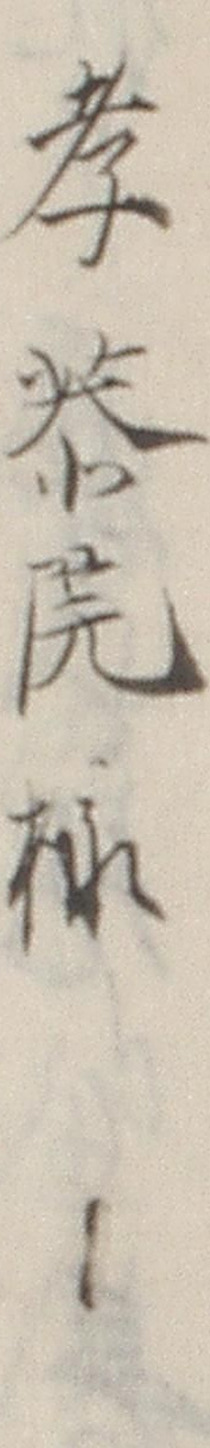孝恭院様
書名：[諸国災害記録]
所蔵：東京大学地震研究所図書室 Earthquake Research Institute Library, The University of Tokyo, JAPAN
